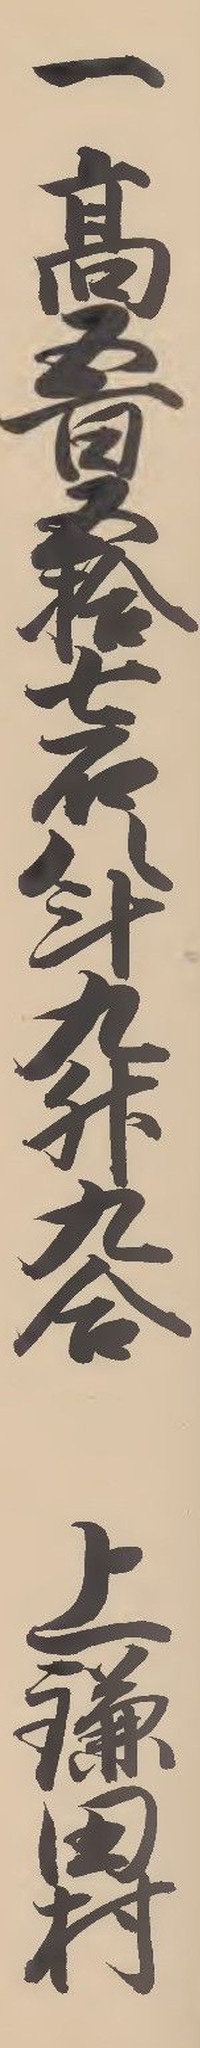一高五百五拾七石八斗九升九合上鎌田村
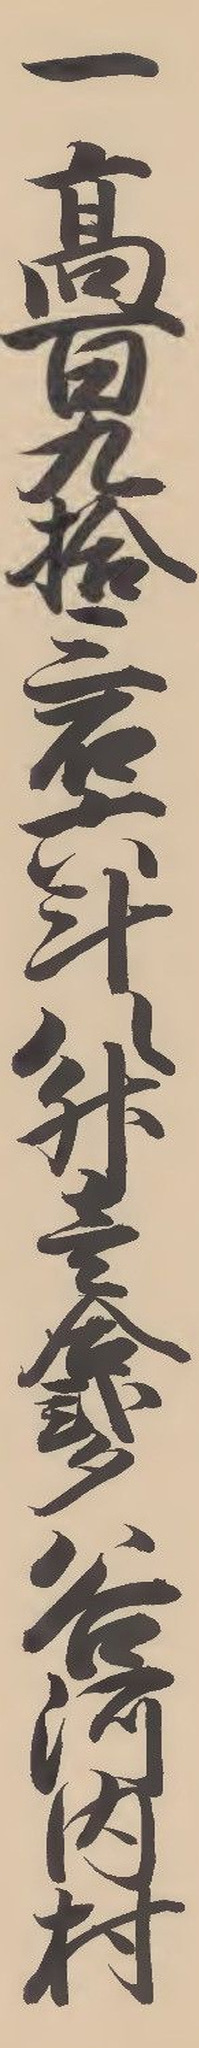一高百九拾三石六斗八升壱合弐勺谷河内村
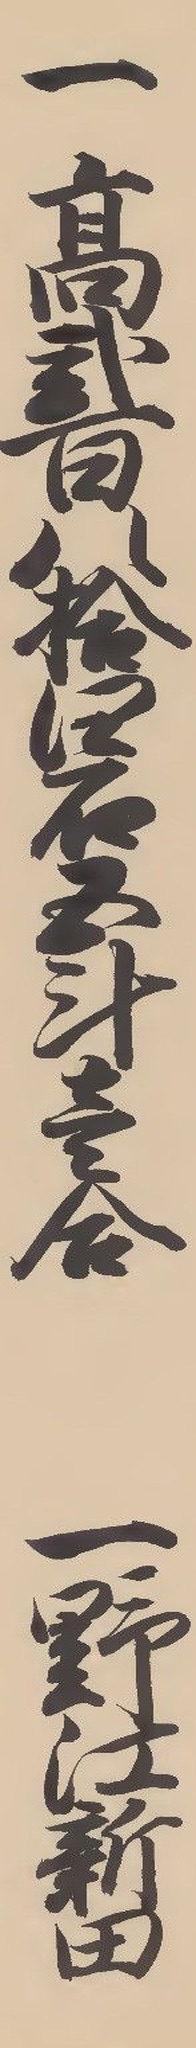一高弐百八拾四石五斗壱合一野江新田
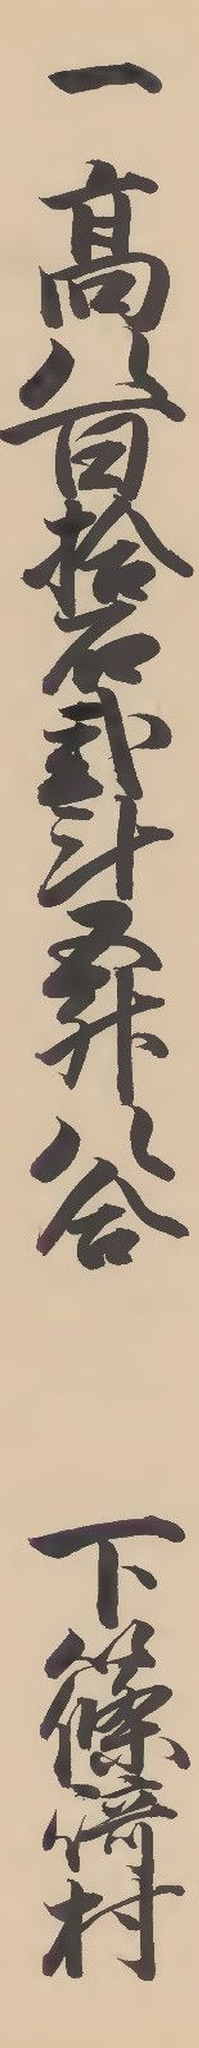一高八百拾石弐斗五合下篠崎村

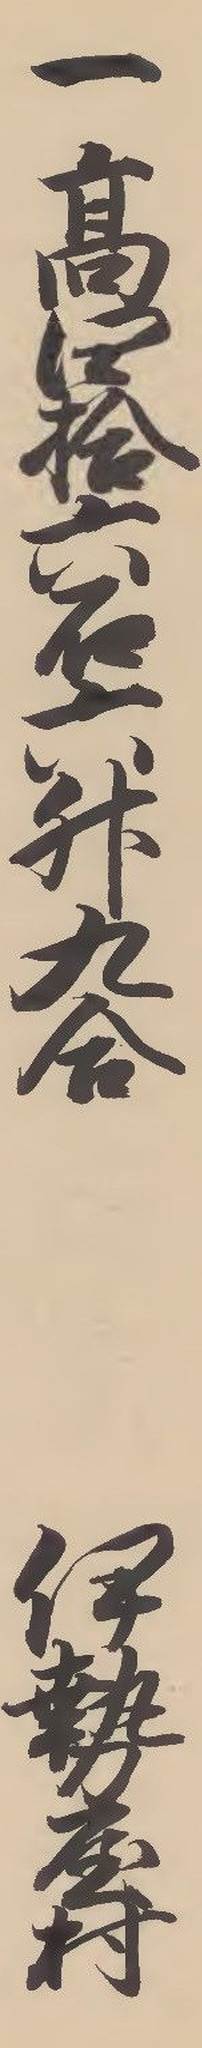一高四拾六石六升九合伊勢屋村
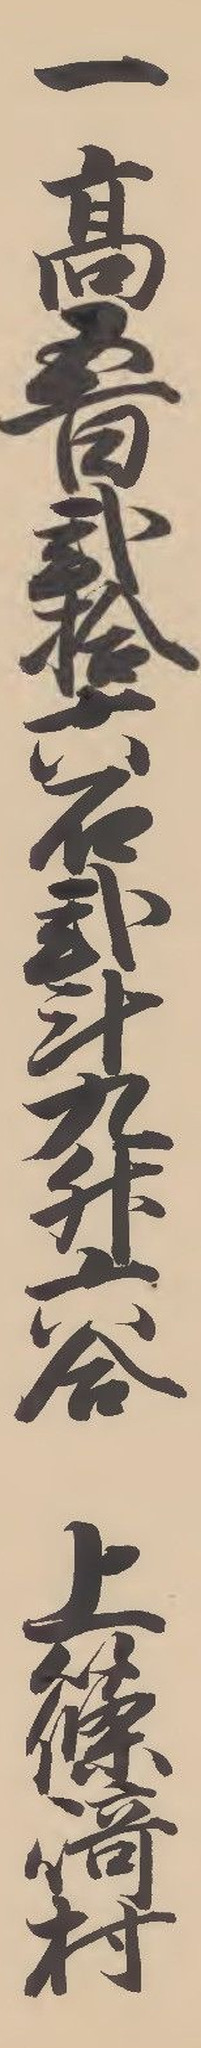一高五百弐拾六石弐斗九升六合上条崎村
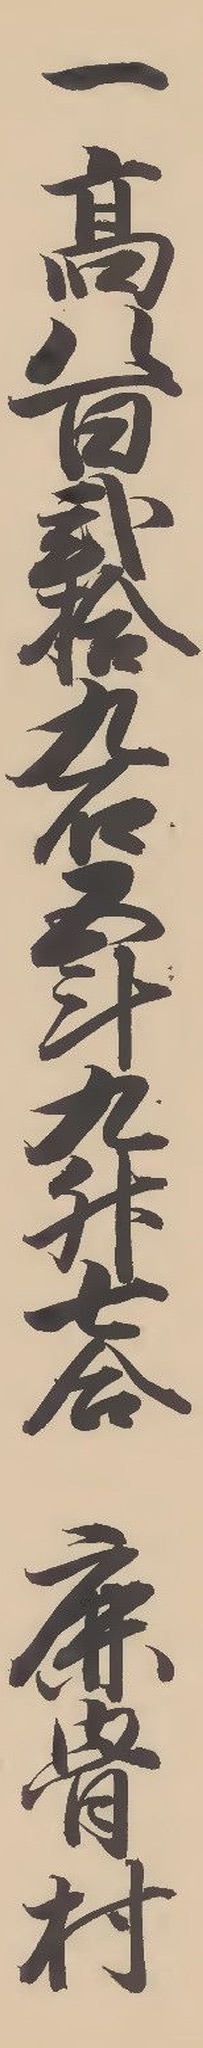一高八百弐拾九石五斗九升七合鹿骨村
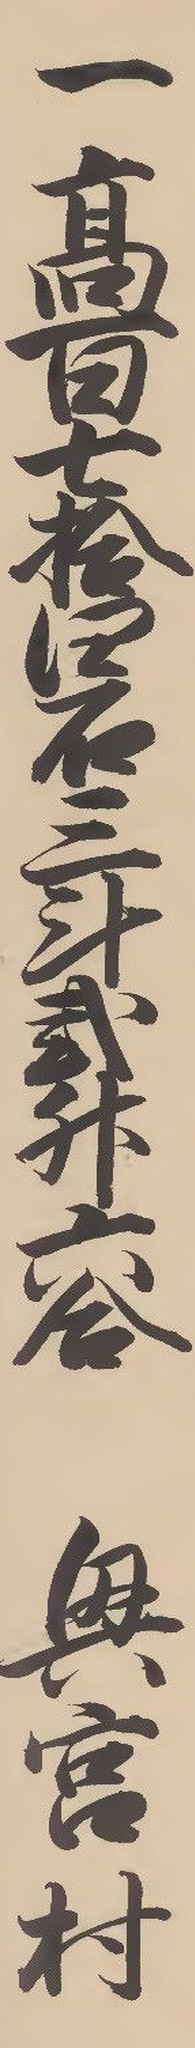一高百七拾四石三斗弐升六合興宮村
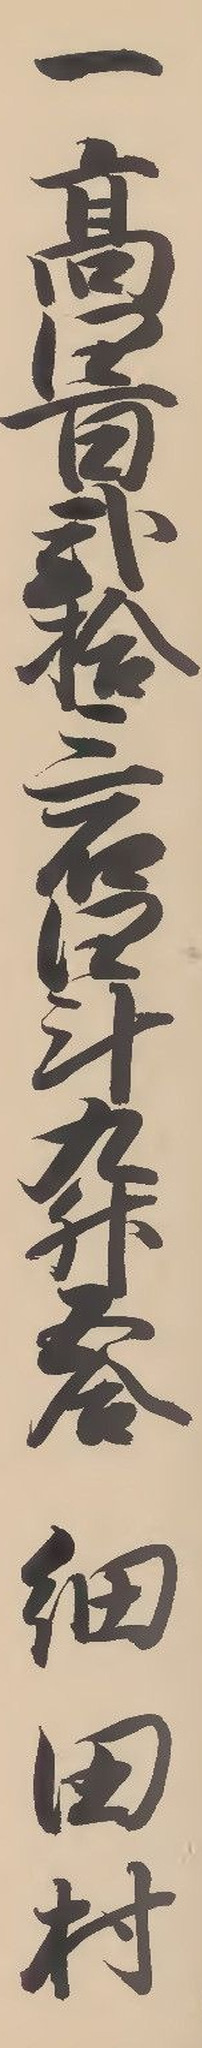一高四百弐拾三石四斗九升五合細田村
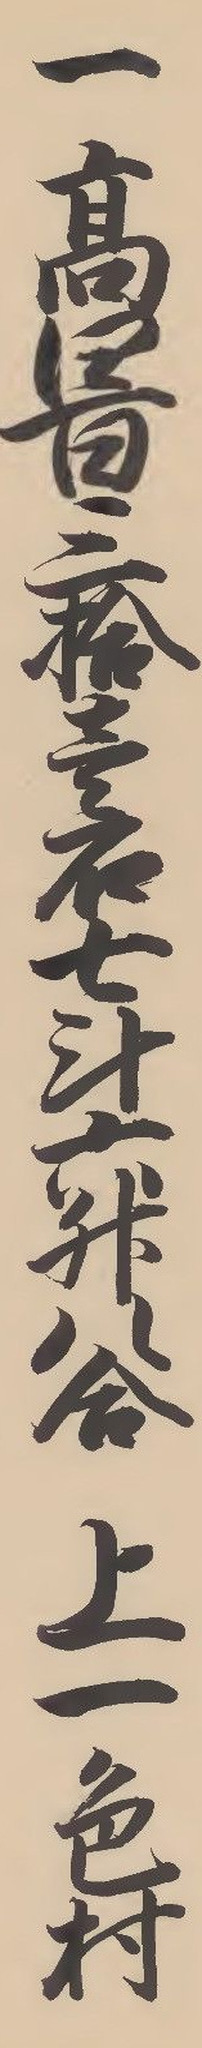一高四百三拾壱石七斗六升八合上一色村
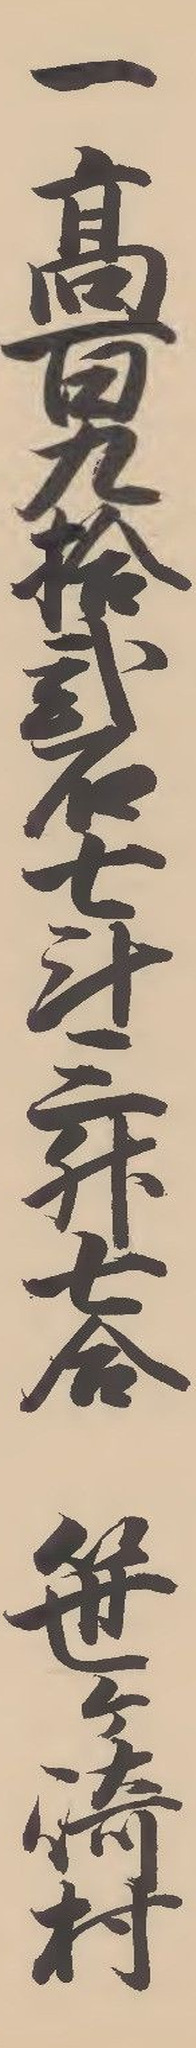一高百九拾弐石七斗三升七合笹ヶ崎村
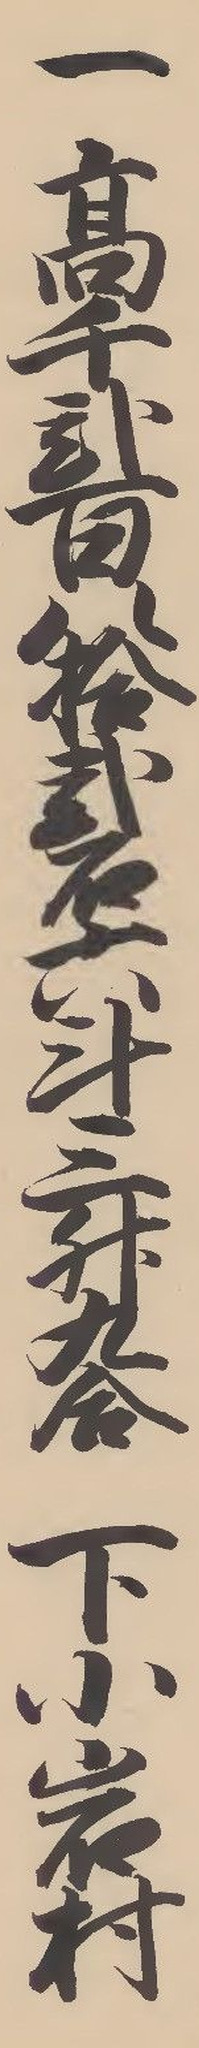一高千弐百八拾弐石六斗三升九合下小岩村

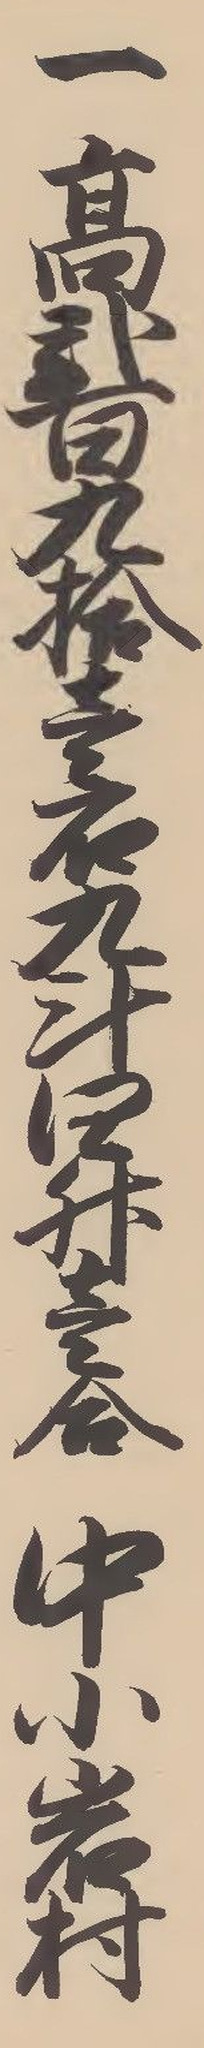一高弐百九拾壱石九斗四升壱合中小岩村
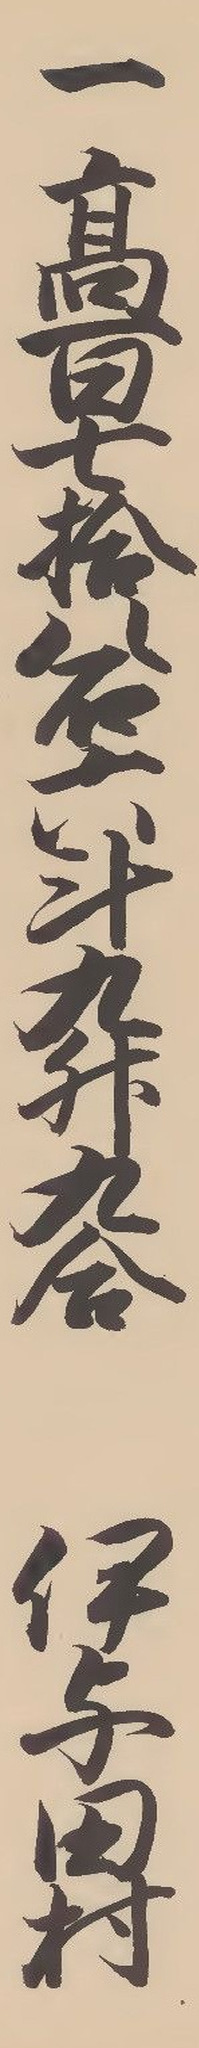一高百七拾八石六斗九升九合伊与田村
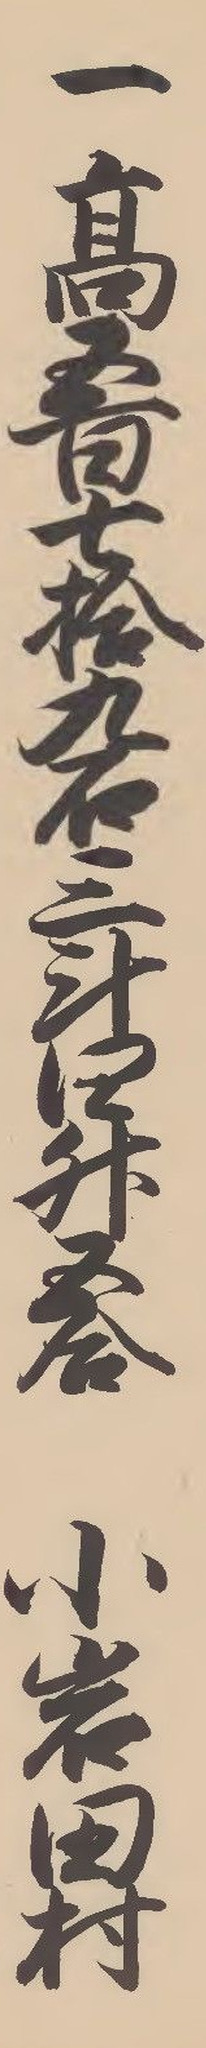一高五百七拾九石三斗四升五合小岩田村
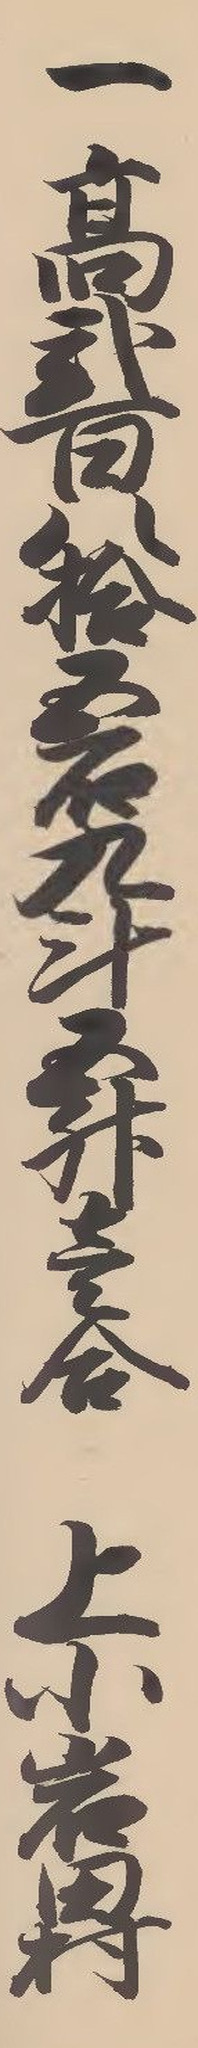一高弐百八拾五石九斗五升壱合上小岩田村
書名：武蔵国郷帳　下
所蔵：国立公文書館 National Archives of Japan
